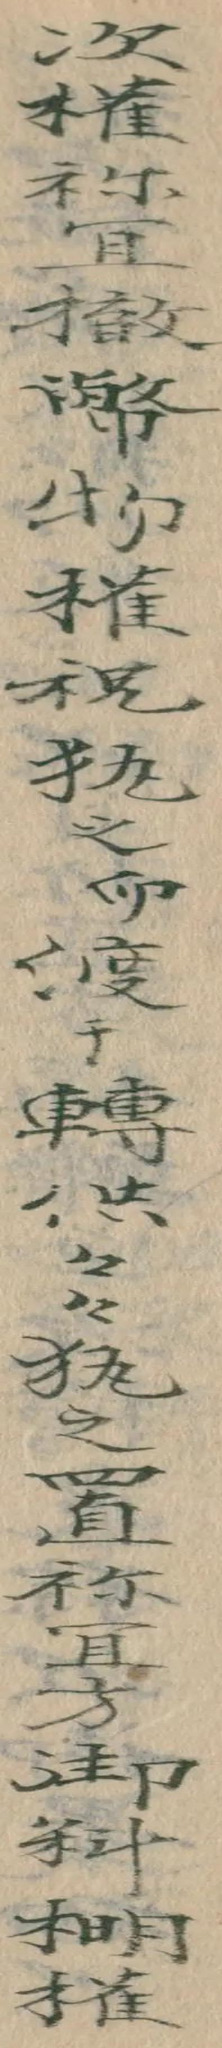次権祢宜撤幣物権祝執之而渡于転供々々執之置祢宜方御料棚権
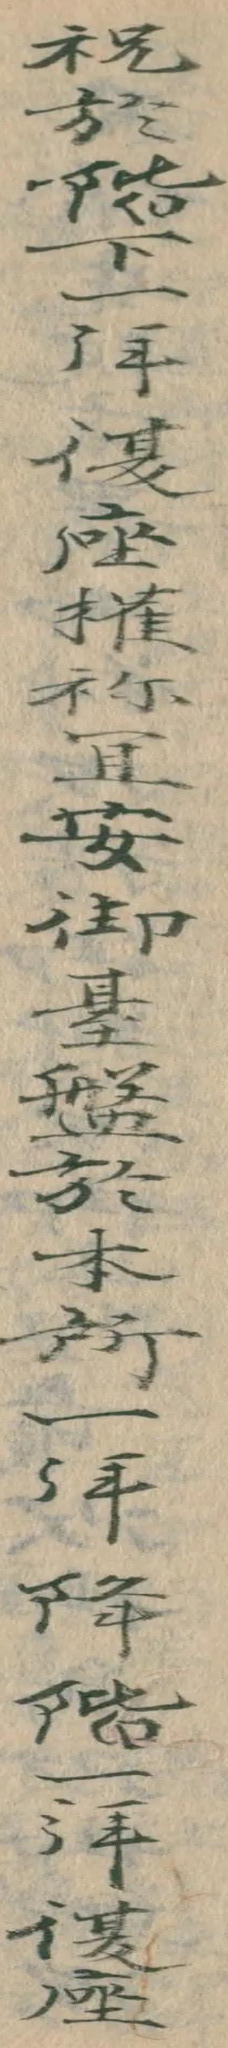祝於階下一拝復座権祢宜安御台盤於本所一拝降階一拝復座

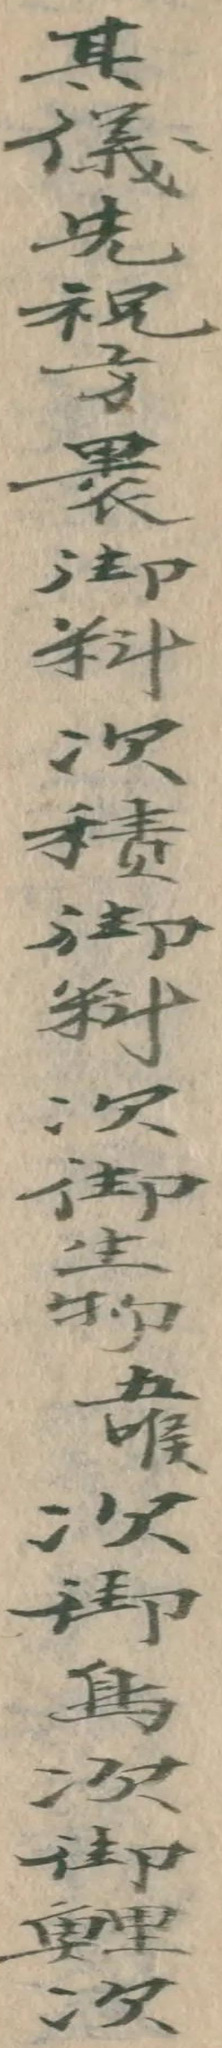其儀先祝方褁御料次積御料次御生物五喉次御鳥次御鯉次
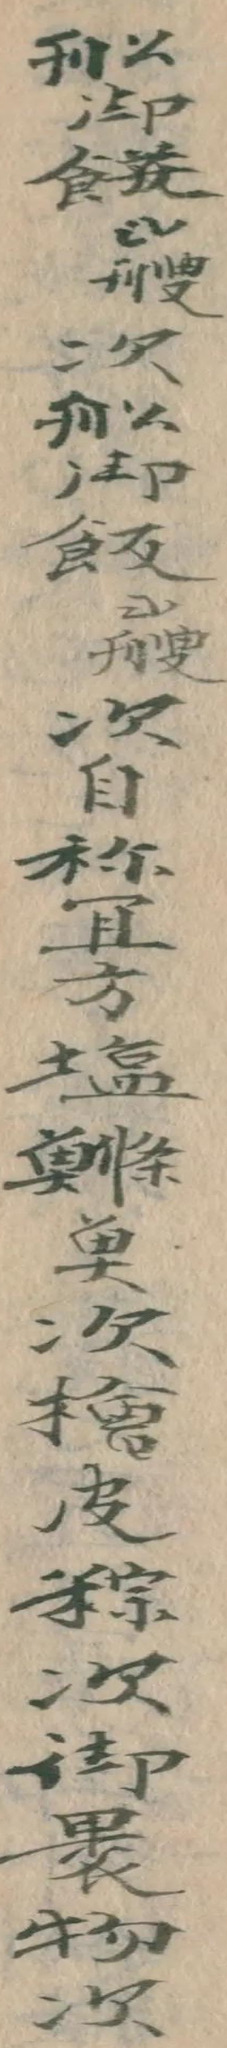船御餅弐艘次船御飯弐艘次自祢宜方塩鰷魚次桧皮粽次御褁物次
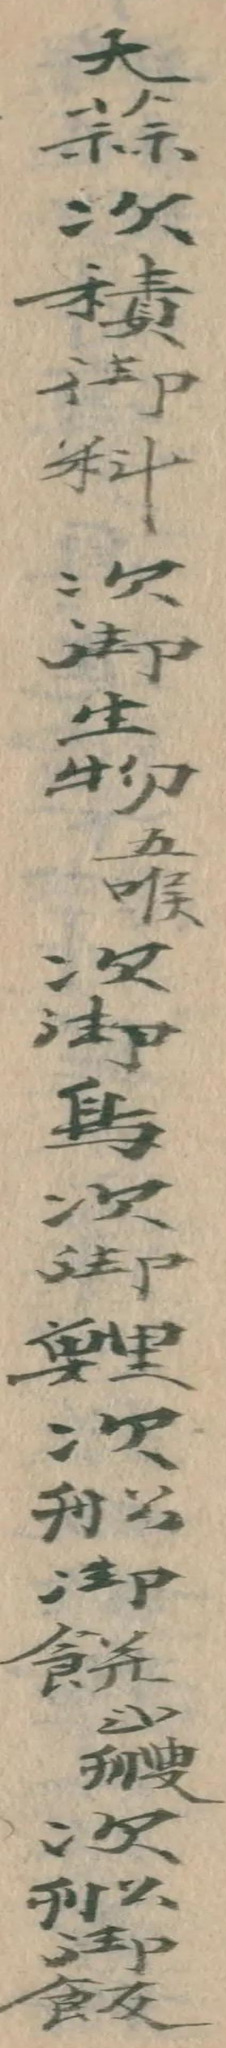大蒜次積御料次御生物五喉次御鳥次御鯉次船御餅弐艘次船御飯

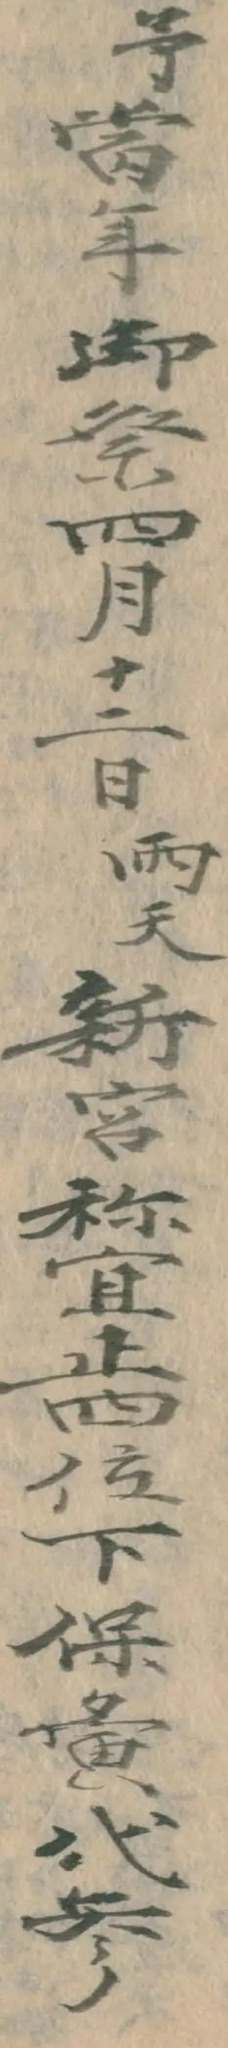予当年御祭四月十二日雨天新宮祢宜正四位下保寅代参
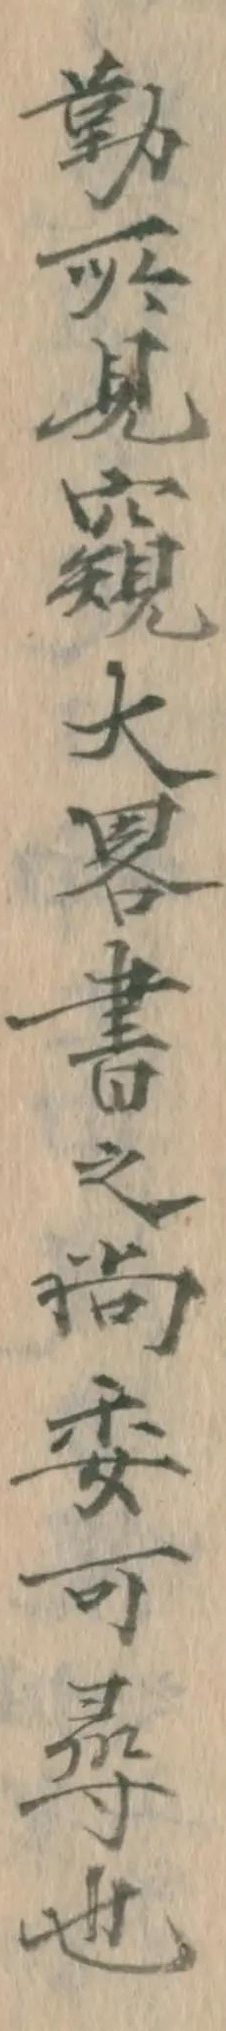勤所見窺大略書之尚委可尋也
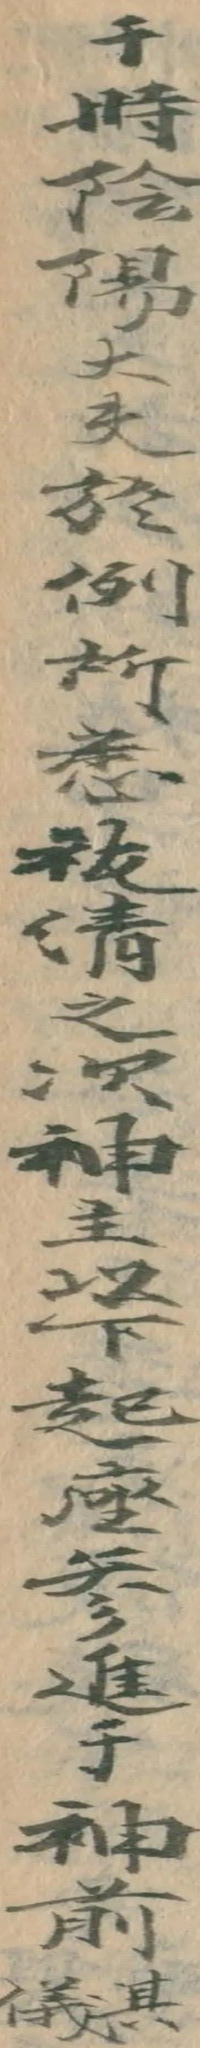于時陰陽大夫於例所悉祓清之次神主以下起座参進于神前其儀

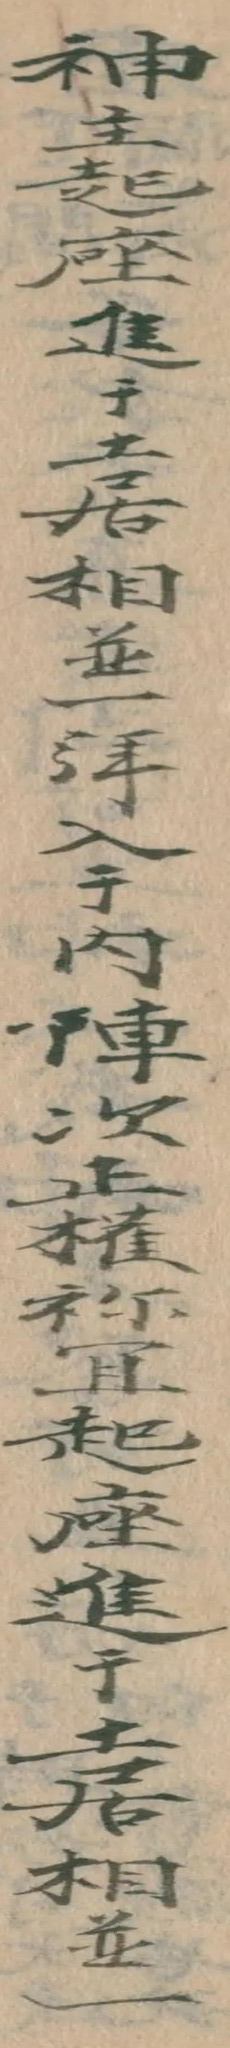神主起座進于土居相並一拝入于内陣次正権祢宜起座進于土居相並一
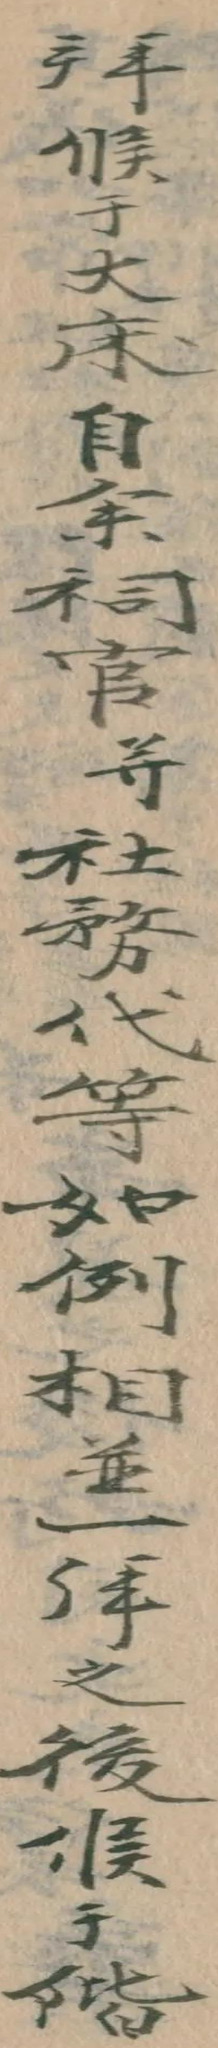拝候于大床自余祠官并社務代等如例相並一拝之後候于階
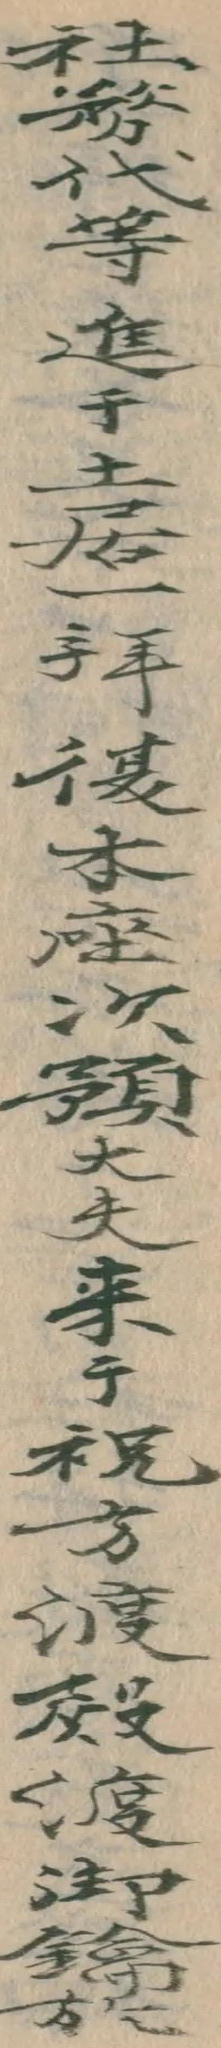社務代等進于土居一拝復本座次預大夫来于祝方渡殿渡御鑰於
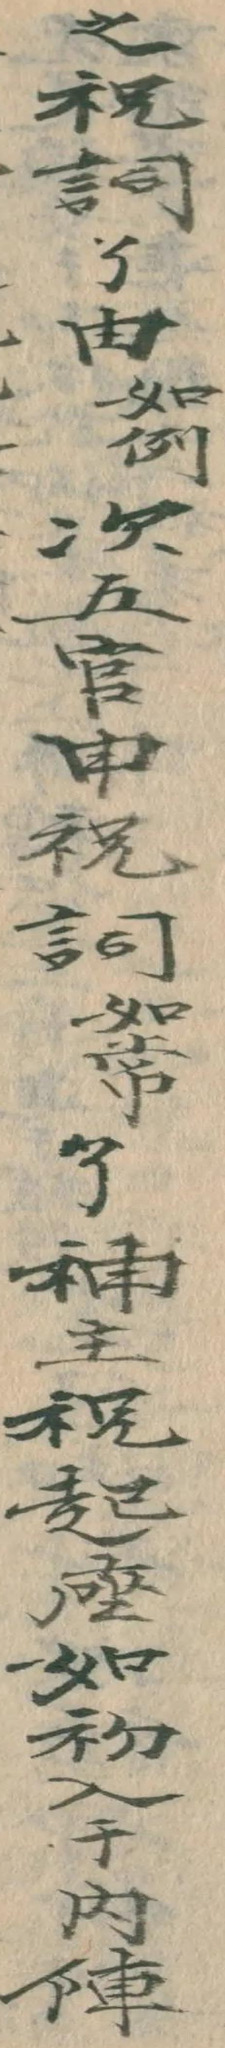之祝詞了由如例次五官申祝詞如常了神主祝起座如初入于内陣

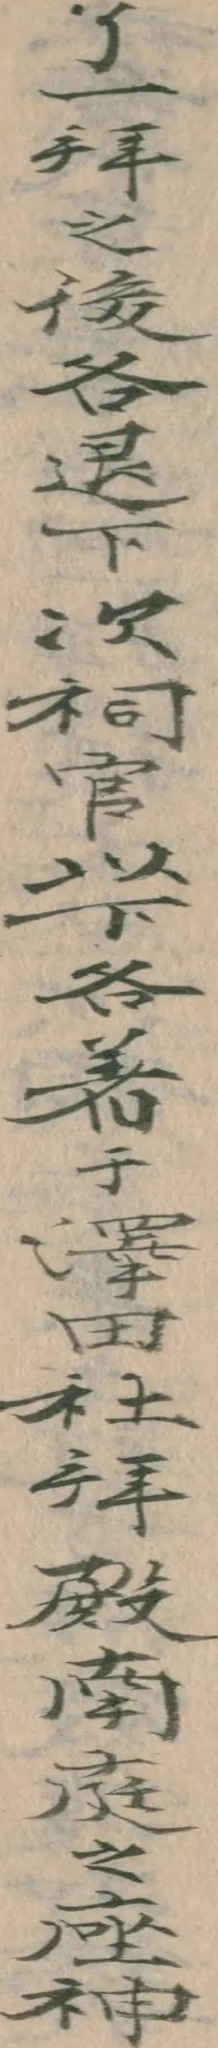了一拝之後各退下次祠官以下各着于沢田社拝殿南庭之座神

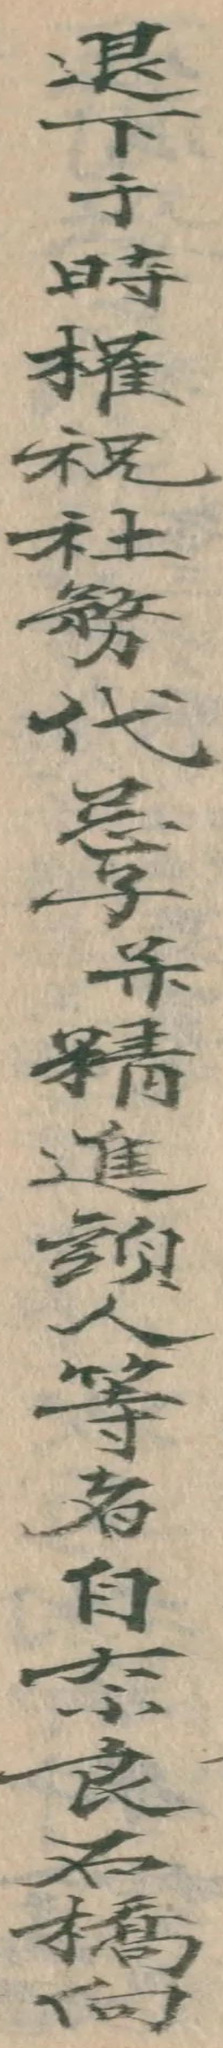退下于時権祝社務代忌子并精進頭人等者自奈良石橋向
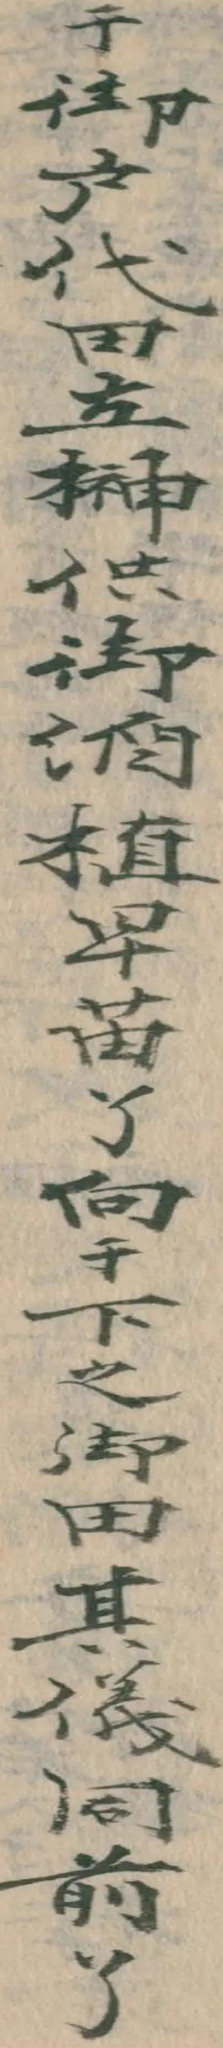于御戸代田立榊供御酒植早苗了向于下之御田其儀同前了
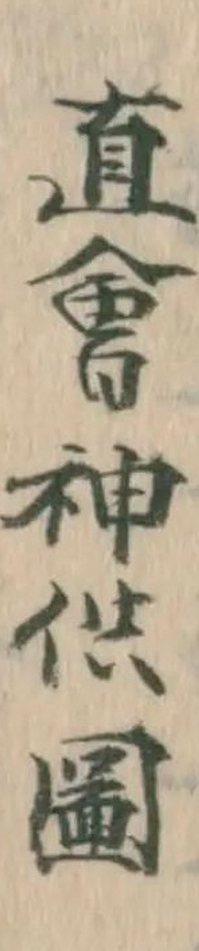直会神供図
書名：賀茂社記録. 第9冊
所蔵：国立国会図書館 National Diet Library, JAPAN
